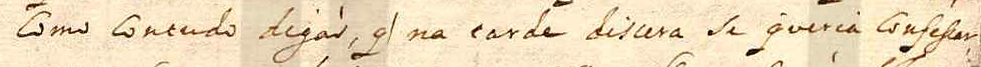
Como contudo digaõ, q̄ na tarde discera se queria confessar,
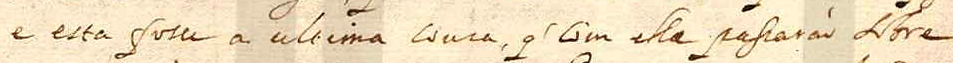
e esta fosce a ultima couza, q̄ Com elle passaraõ sobre
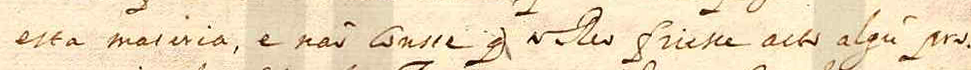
esta materia, e naõ conste q̄ o Reo fizesse acto algū pro
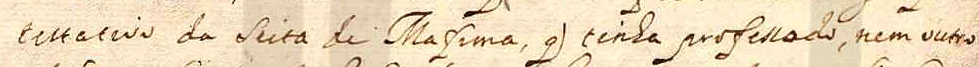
testativo da seita de Mafoma, q̄ tinha professado, nem outro
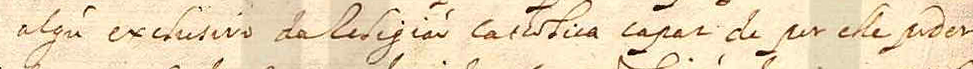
algū exclusivo da Religiaõ catholica capaz de por elle poder
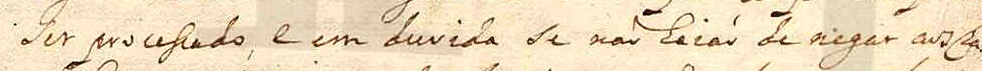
ser processado, e em duvida se naõ haiaõ de negar aos Ca
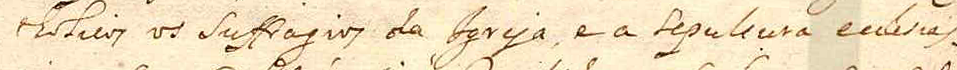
tholicos os suffragios da Igreja, e a sepultura ecclesias
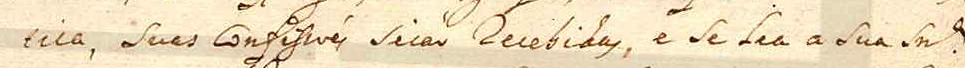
tica, suas confissoẽs seiaõ Recebidas, e se Lea a sua sn.a
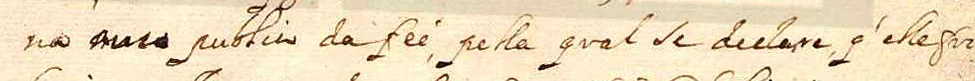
na meza publica da feé, pella qual se declare, q̄ elle foi
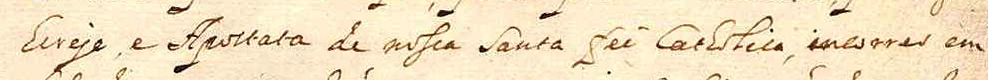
hereje, e Apostata de nossa Santa feé Catholica, incorreo em
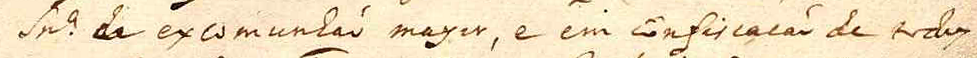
sn.a de excomunhaõ mayor, e em confiscaçaõ de todos
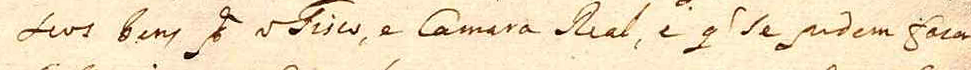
seos bens pa o Fisco, e Camara Real, e q̄ se podem fazer
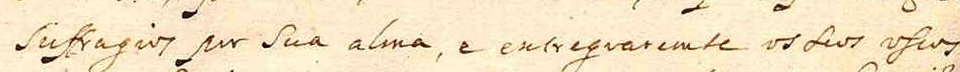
sufragios por sua alma, e entreguaremse os seos ossos
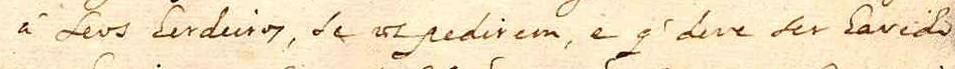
á seos herdeiros, se oz pedirem, e q̄ deve ser havido
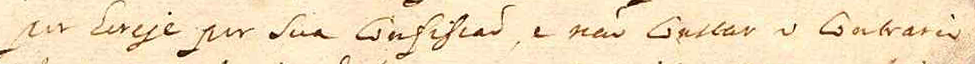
por hereje por sua Confissaõ, e naõ Constar o Contrario
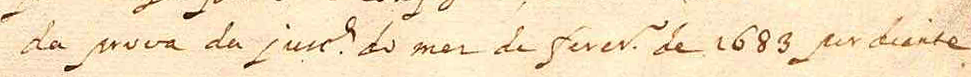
da prova da just.a do mez de fever.o de 1683 por diante
